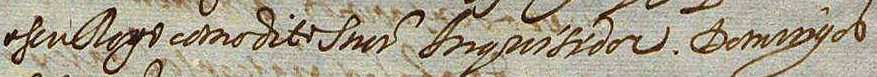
a seu Rogo com o dito Snor̄ Inquisidor. Domingos
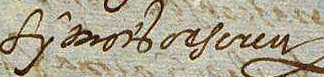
symois o escreuj
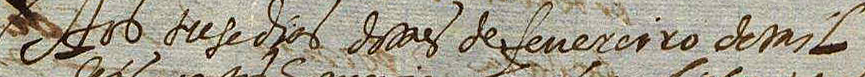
Aos trese dias do mes de feuereiro de miL
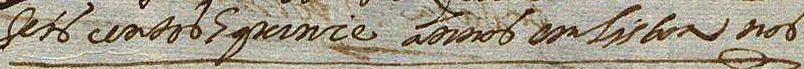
seiscentos E quinze annos em Lisboa nos
